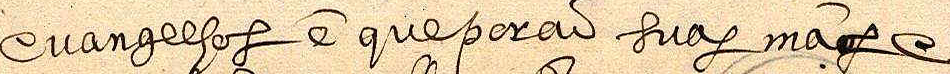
euangelhos ē que poraõ suas mãos e
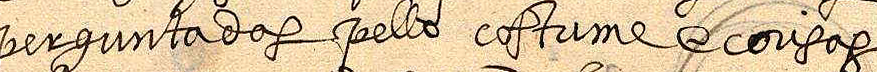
perguntadas pello costume e cousas
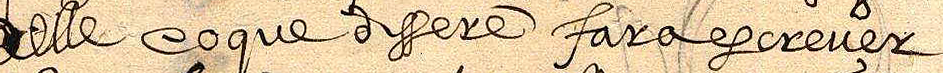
delle e o que disserē fara escreuer
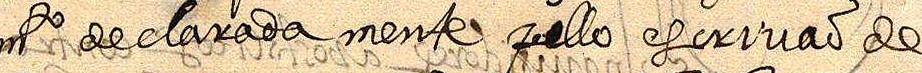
mto declaradamente pello escriuaõ de
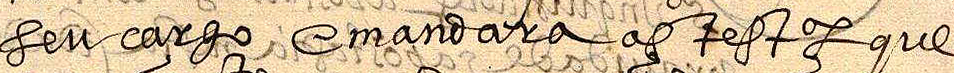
seu cargo e mandara as testas que
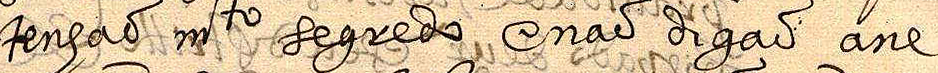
tenhaõ mto segredo e naõ digaõ a ne
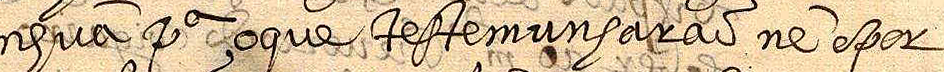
nhuā pa o que testemunharaõ nē o por
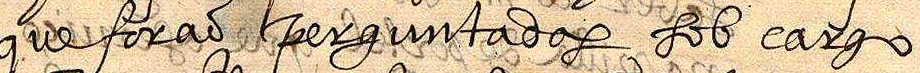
que foraõ perguntadas sob cargo
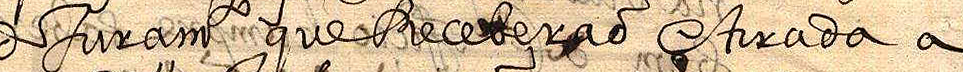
do Juramto que Receberaõ e tirada a
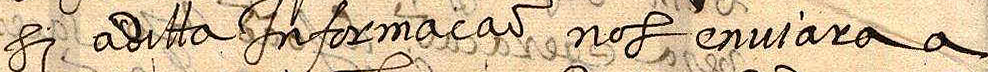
sj a ditta Jnformacaõ nos enuiara a
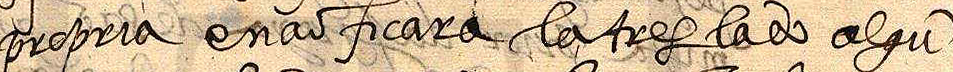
propria e naõ ficara la treslado algū
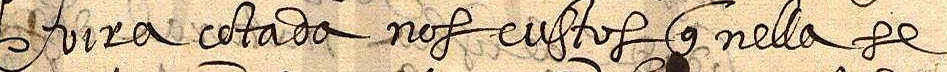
e vira cōtada nos custos q̄ nella se
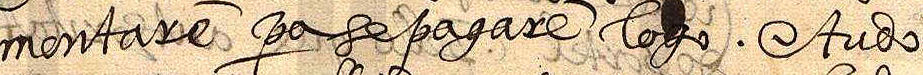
montarē ꝑa se pagarē logo. e tudo
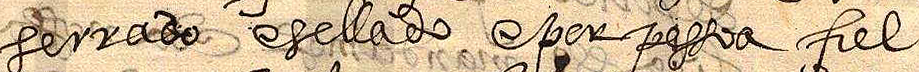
serrado e sellado e per pessoa fiel
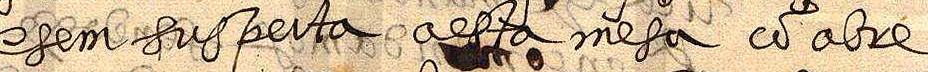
e sem suspeita a esta mesa cō a bre
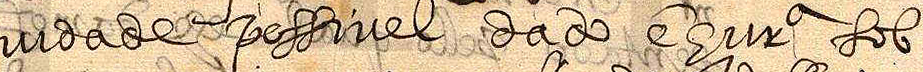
uidade possiuel dado ē Eura sob
